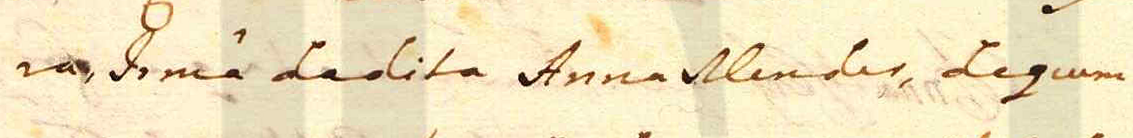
ra, Irmã da dita Anna Mendes, de quem
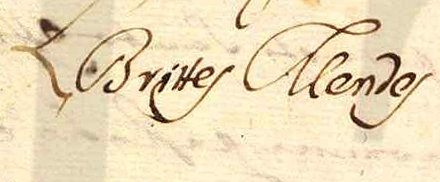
L Brites Mendes
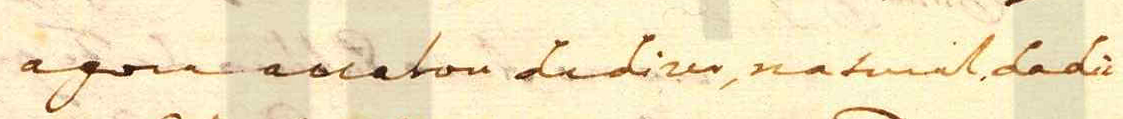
agora a acabou de dizer, natural, da di
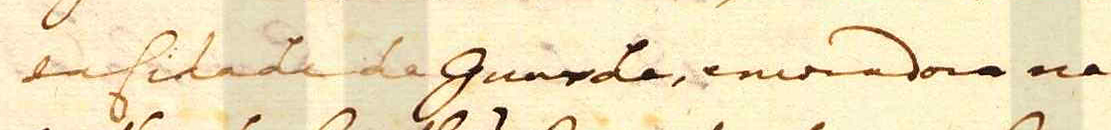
ta Cidade da Guarda, e moradora na
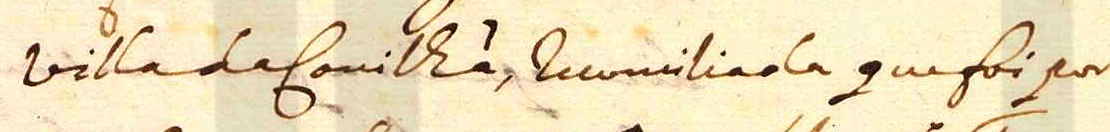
villa de Couilhã, Reconciliada que foi por
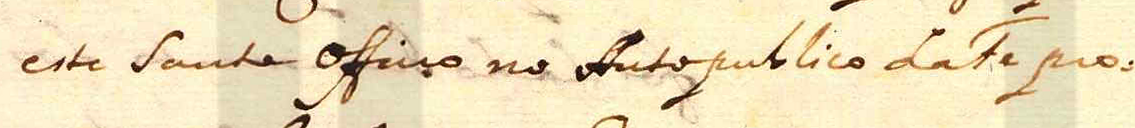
este santo officio no Auto publico da Fe pro
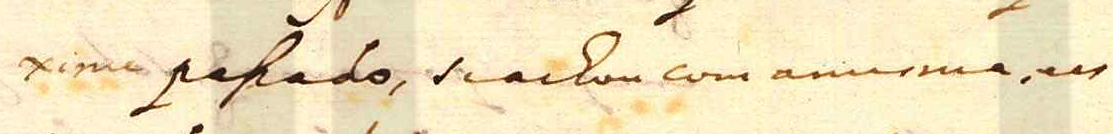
xime passado, se achou com a mesma, e es
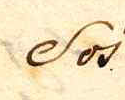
Sós
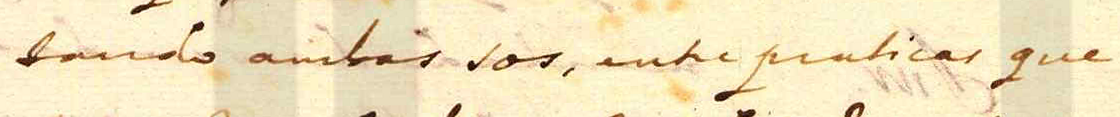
tando ambas sos, entre praticas que
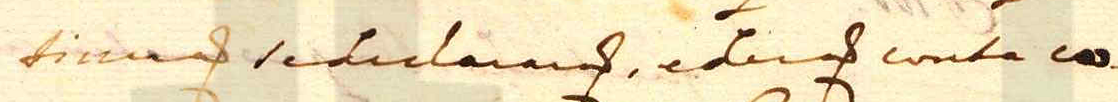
tiueraõ se declararaõ, e deraõ conta co
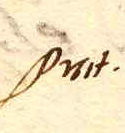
prat.
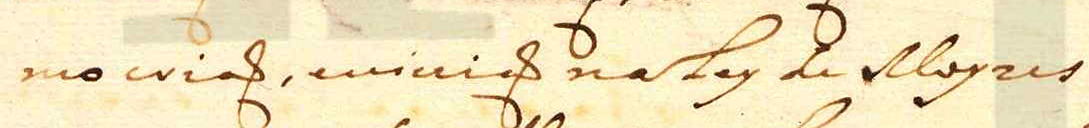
mo criaõ, e uiuiaõ na Ley de Moyzes
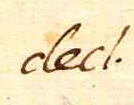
decl.
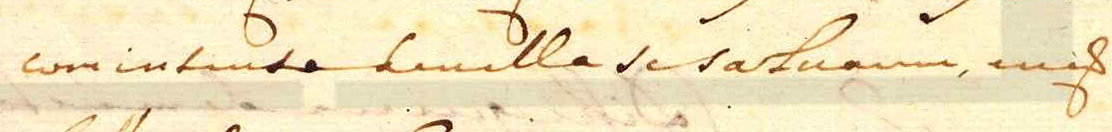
com intento de nella se saluarem, e naõ
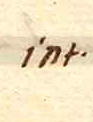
int.
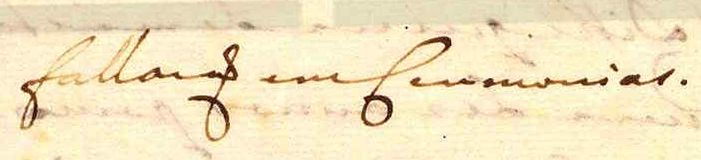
fallaraõ em Ceremonias.
